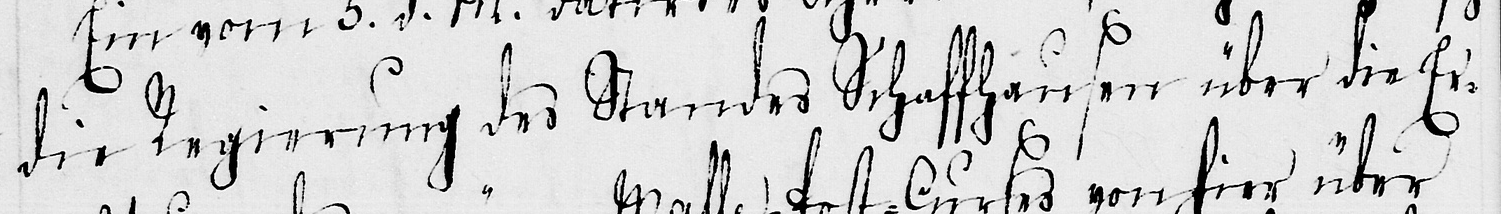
die Regierung des Standes Schaffhausen über die Er¬
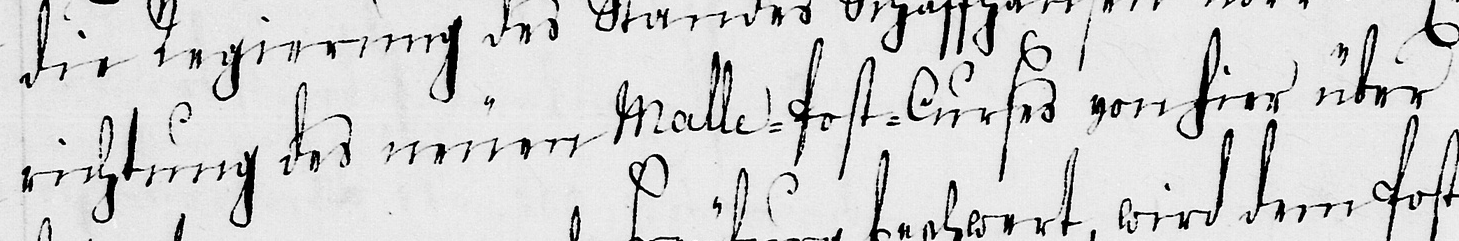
richtung des neuen Malle-Post-Curses von hier über
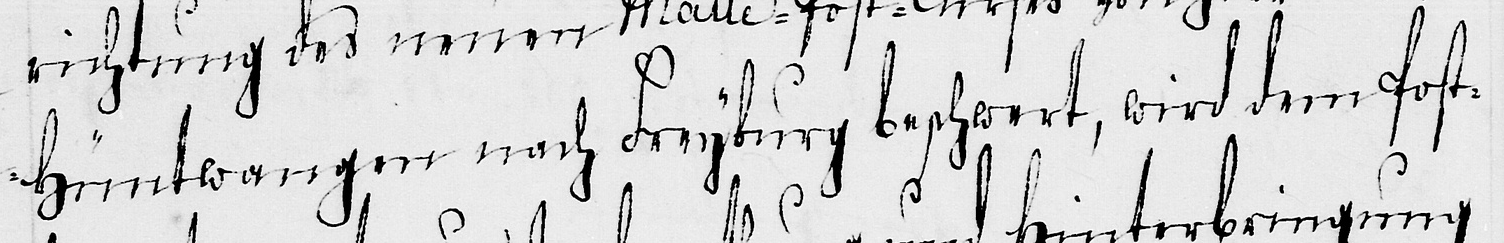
Hüntwangen nach Freyburg beschwert, wird dem Pos¬
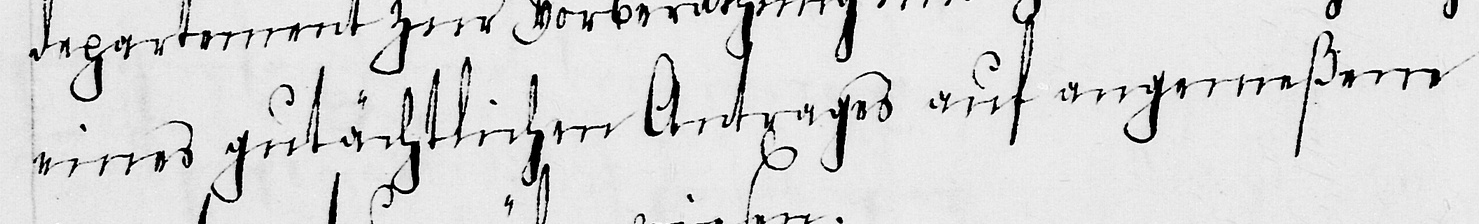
eines gutächtlichen Antrages auf angemeßene
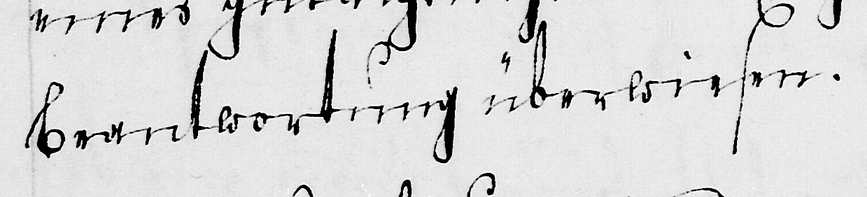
Beantwortung überwiesen.
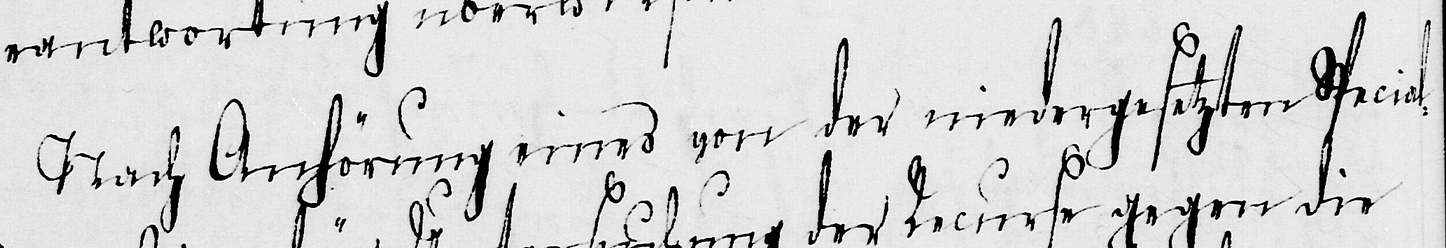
Nach Anhörung eines von der niedergesetzten Speci¬
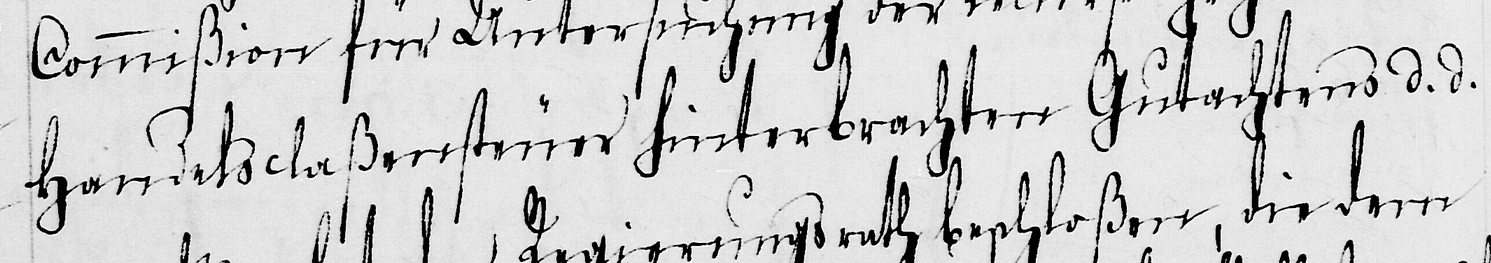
Handelsclaßensteuer hinterbrachten Gutachtens d. d.
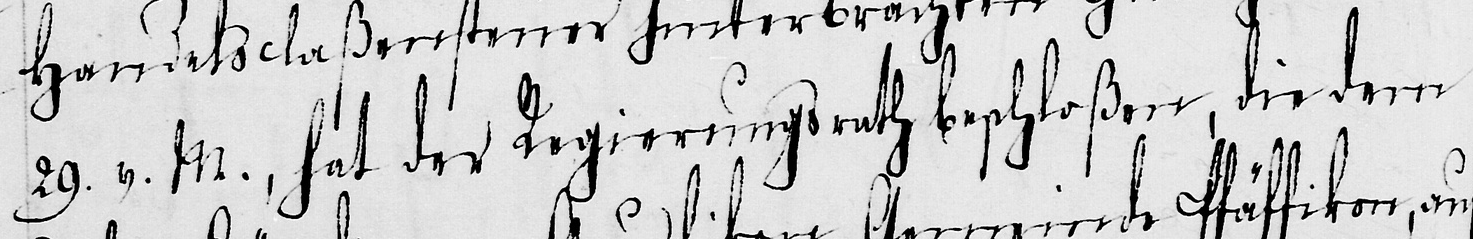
29. v. M., hat der Regierungsrath beschloßen, die dem
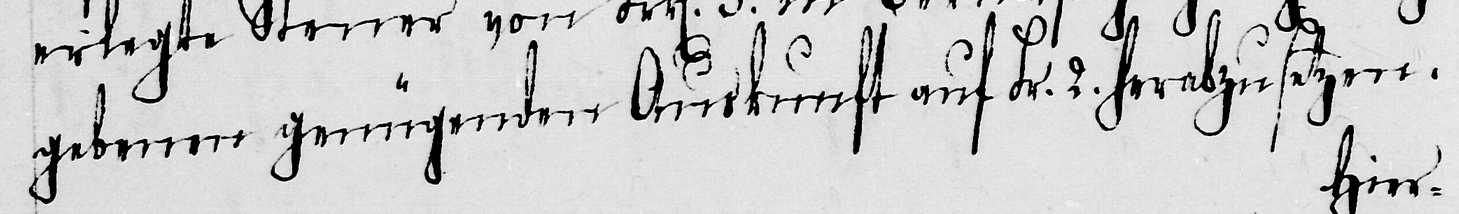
gebenen genügenden Auskunft auf Fr. 2. herabzusetzen.
